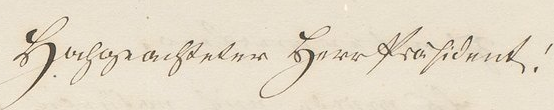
Hochgeachteter Herr Präsident!
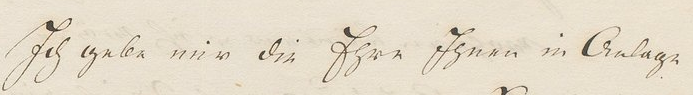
Ich gebe mir die Ehre Ihnen in Anlage
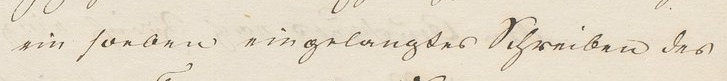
ein soeben eingelangtes Schreiben des
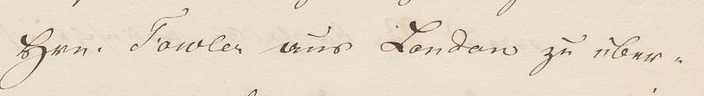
Hrn. Fowler aus London zu über-
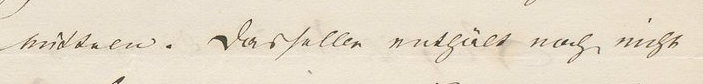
mitteln. Dasselbe enthält noch nicht
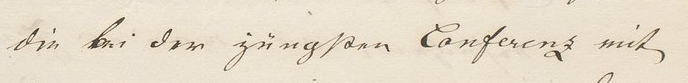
die bei der jüngsten Conferenz mit
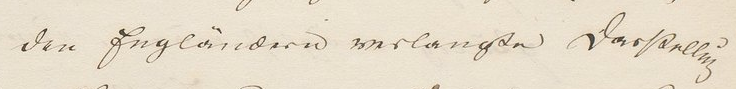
den Engländern verlangte Darstellung
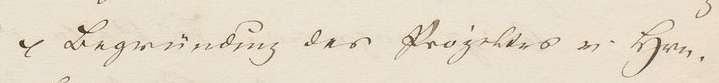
& Begründung des Projektes v. Hrn.
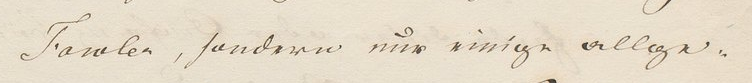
Fowler, sondern nur einige allge-
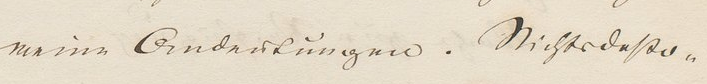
meine Andeutungen. Nichtsdesto-
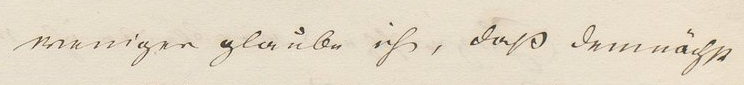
weniger glaube ich, daß demnächst
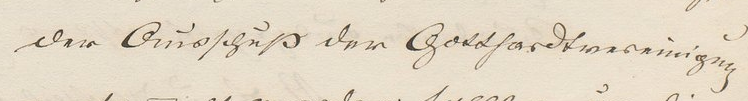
der Ausschuß der Gotthardtvereinigung
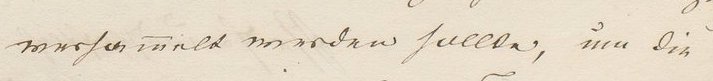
versammelt werden sollte, um die
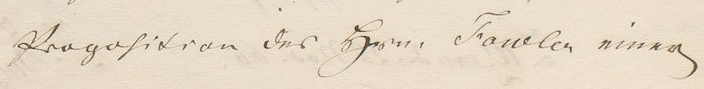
Proposition des Hrn. Fowler einer
